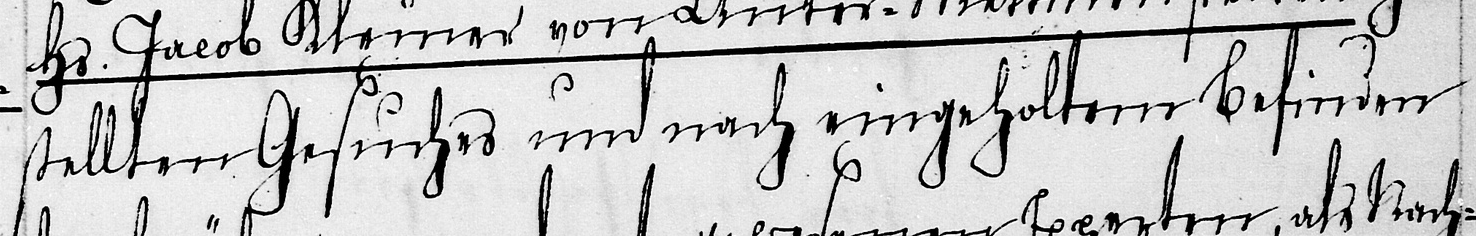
tellten Gesuches und nach eingeholtem Befinden
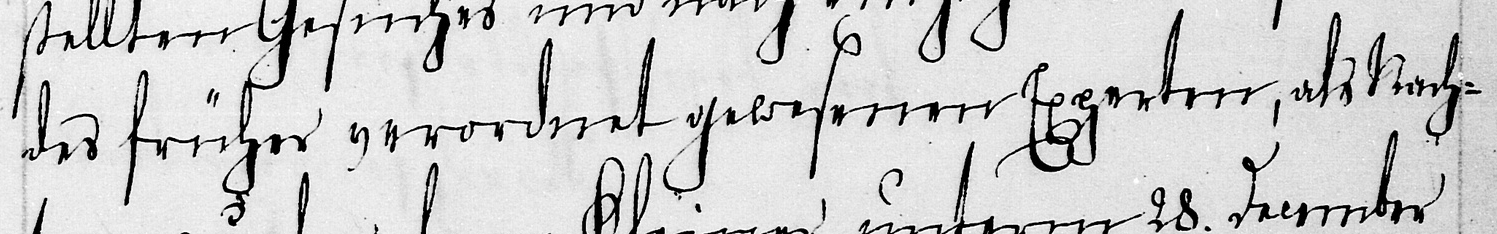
des früher verordnet gewesenen Experten, als Nach¬
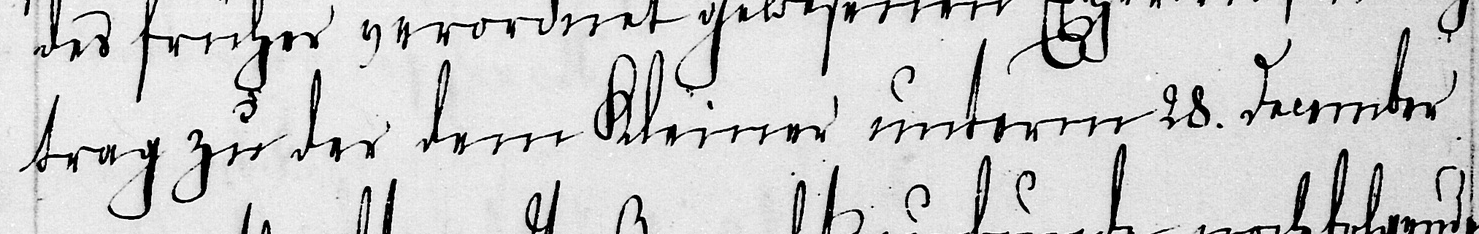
trag zu der dem Kleiner unterm 28. December
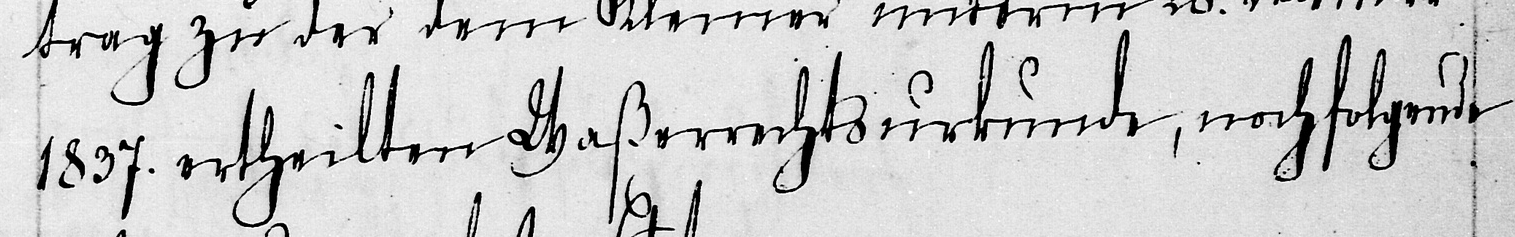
1837. ertheilten Waßerrechtsurkunde, noch folgende
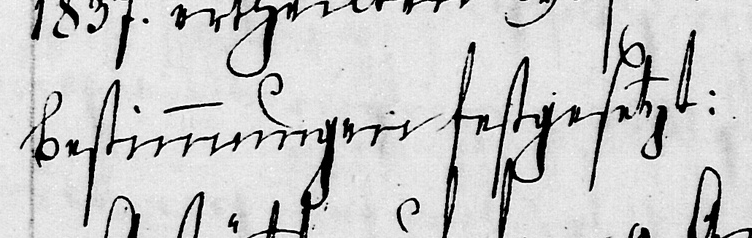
Bestimmungen festgesetzt:
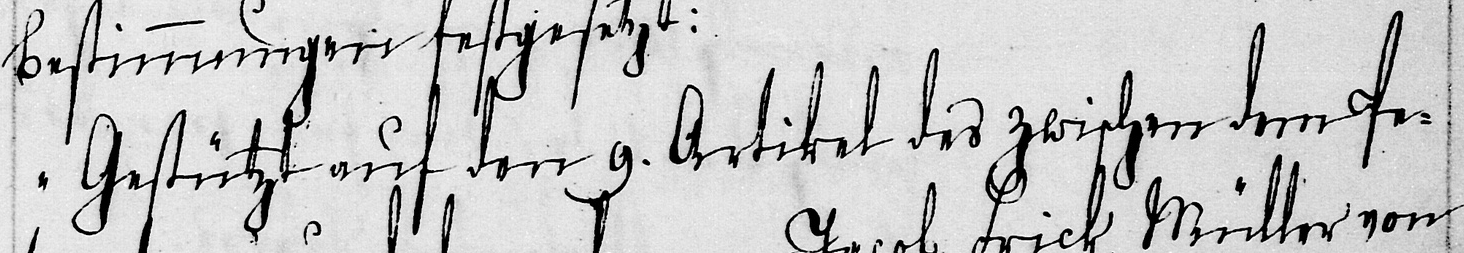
„Gestützt auf den 9. Artikel des zwischen dem Pe¬
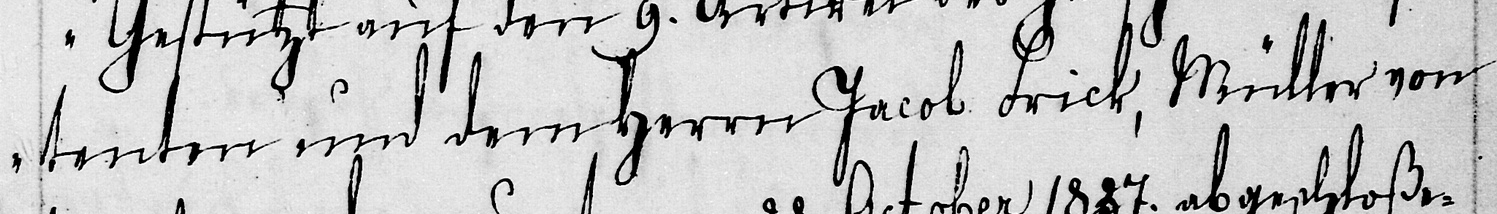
tenten und dem Herrn Jacob Frick, Müller von
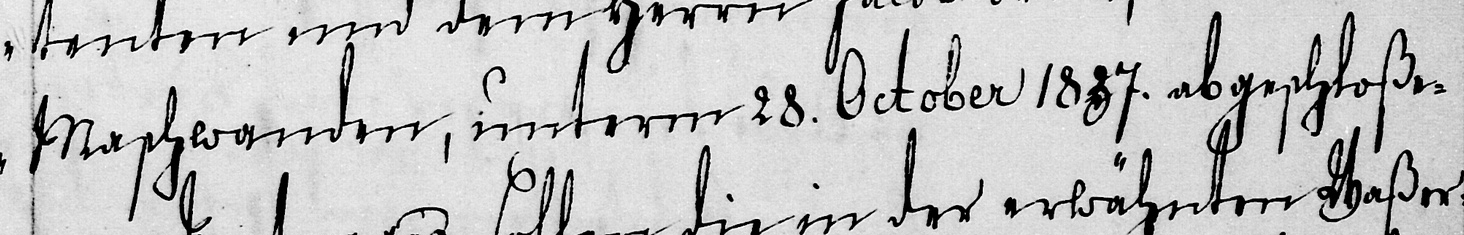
Maschwanden, unterm 28. October 1837. abgeschloße¬
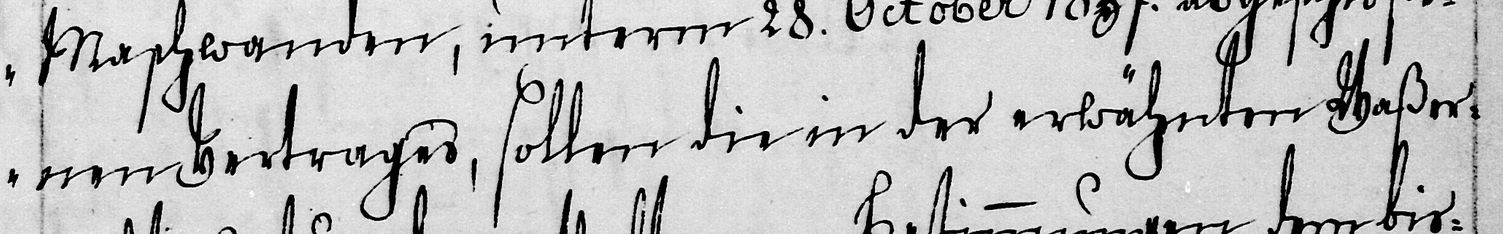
nen Vertrages, sollen die in der erwähnten Waßer¬
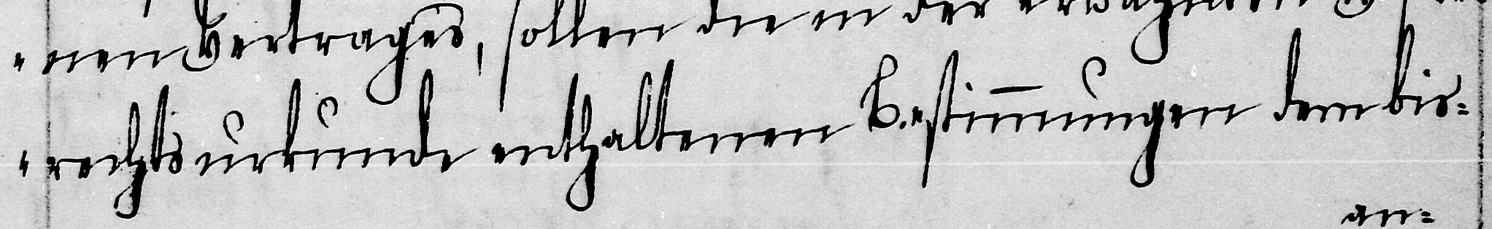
rechtsurkunde enthaltenen Bestimmungen dem bis-
